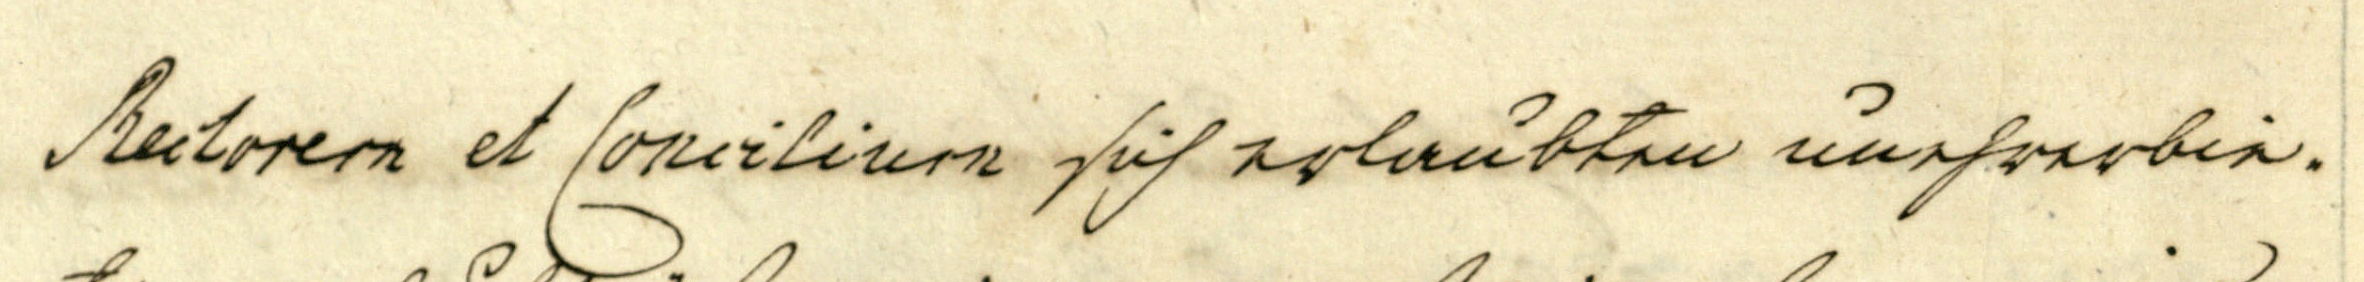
Rectorem et Concilium sich erlaubten unehrerbie
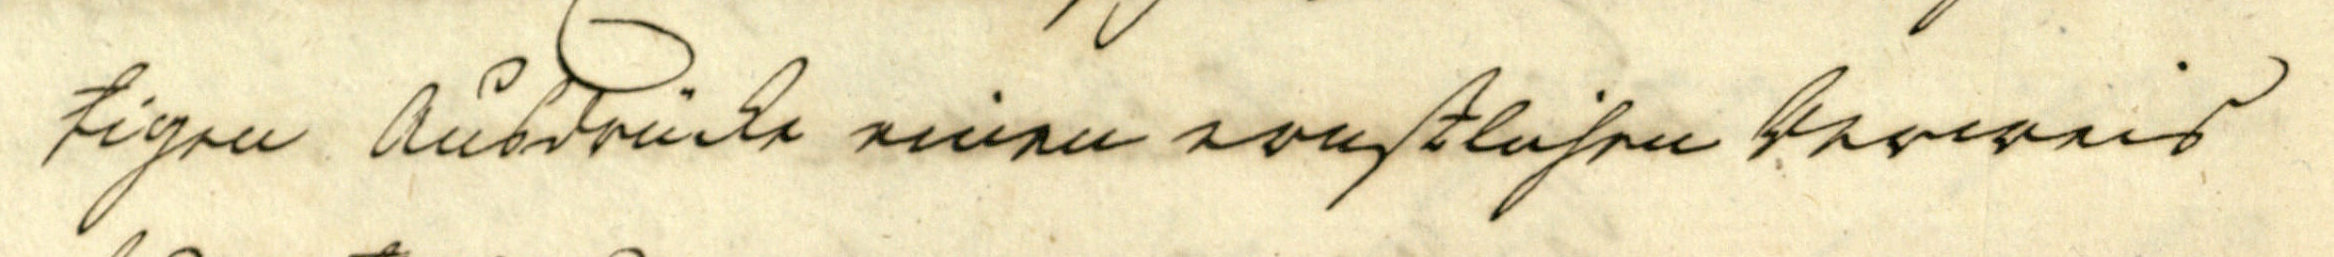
tigen Ausdrücke einen ernstlichen Verweis
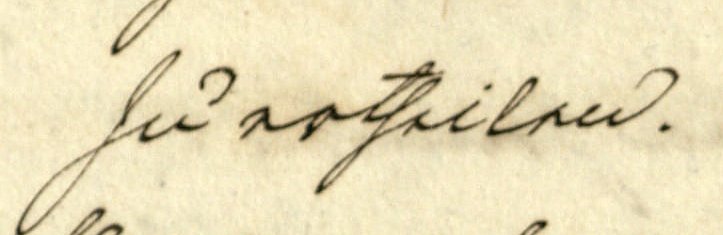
zu ertheilen.
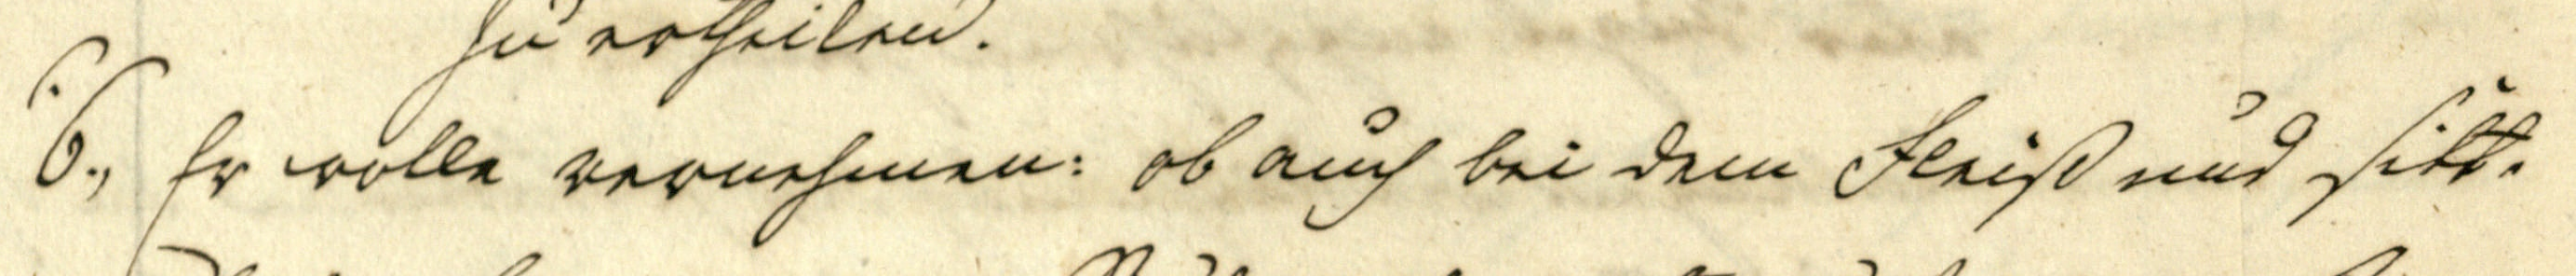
6., Er wolle vernehmen: ob auch bei dem Fleiß und sitt¬
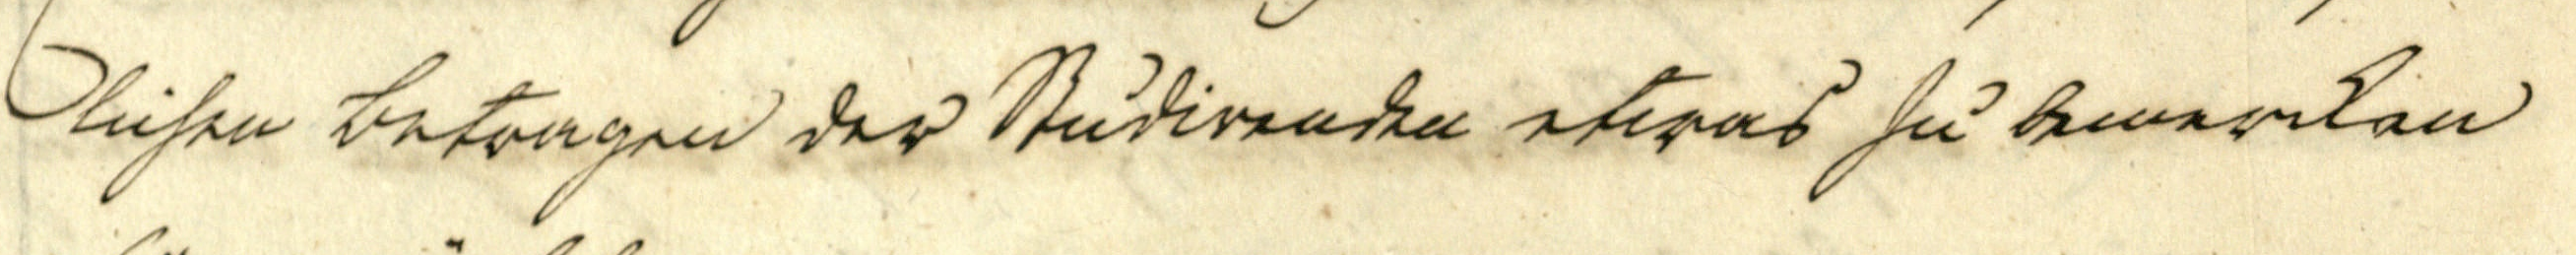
lichen Betragen der Studirenden etwas zu bemercken
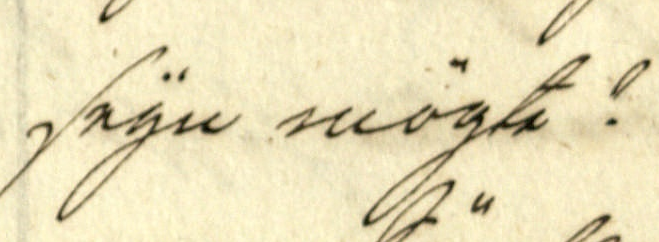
seÿn mögte?
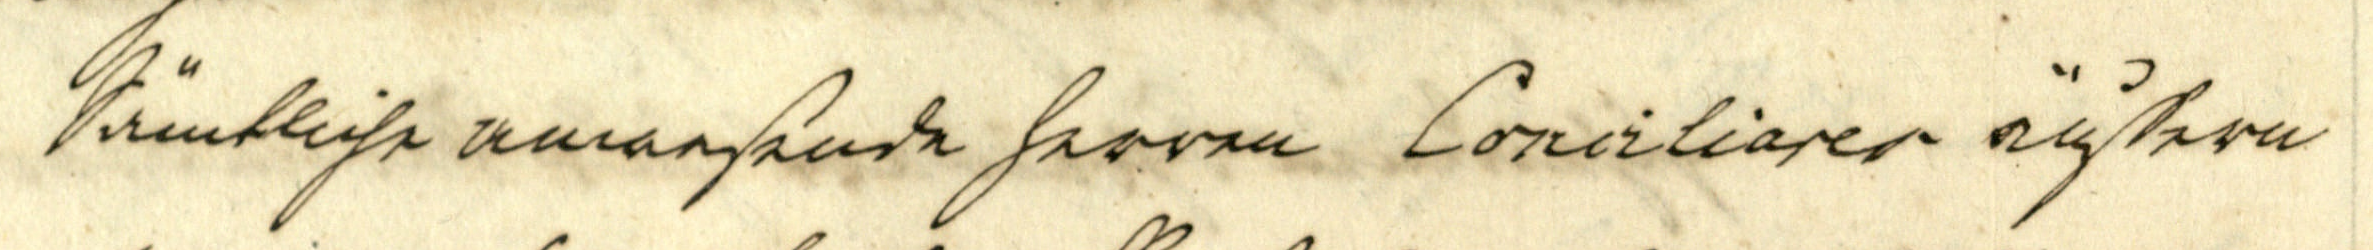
Sämtliche anwesende Herren Conciliares äussern
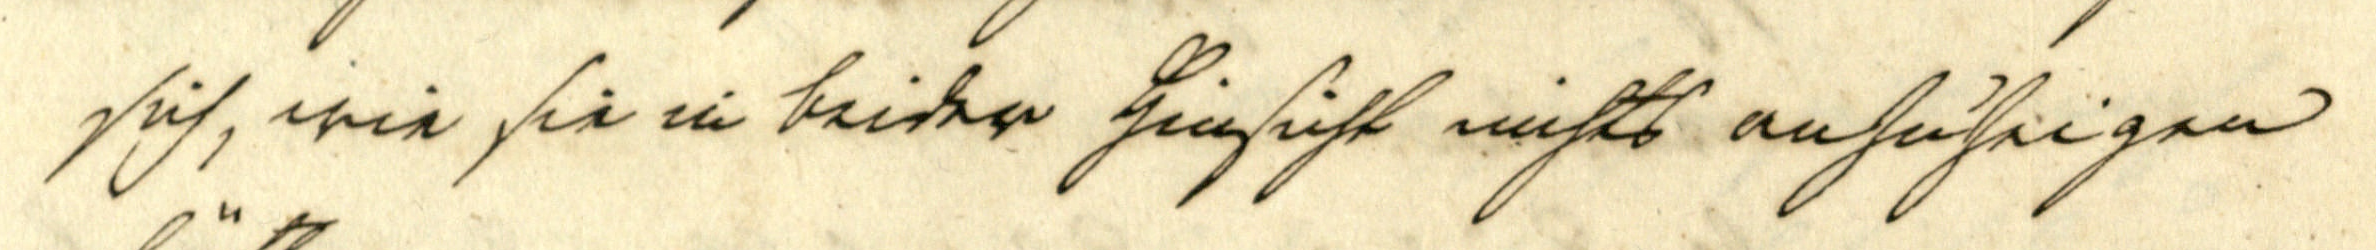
sich, wie sie in beider Hinsicht nichts anzuzeigen
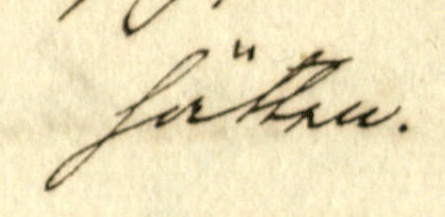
hätten.
